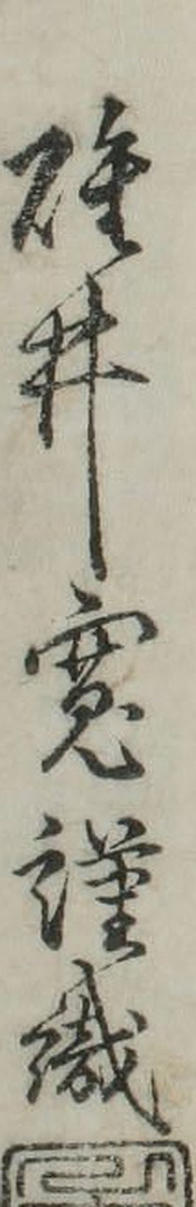碓井寛謹識

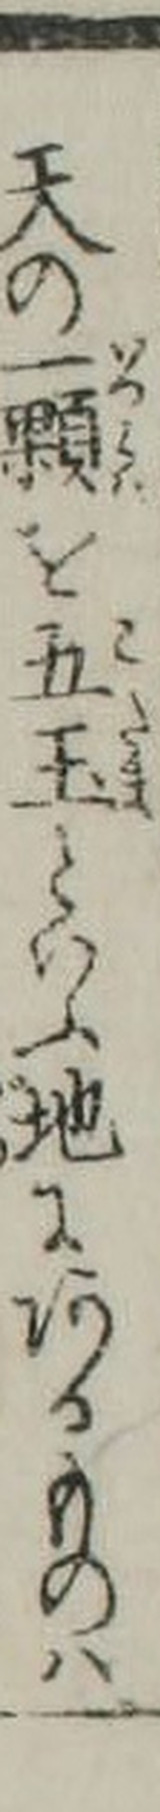天の一顆を五玉といふ地にあるものは
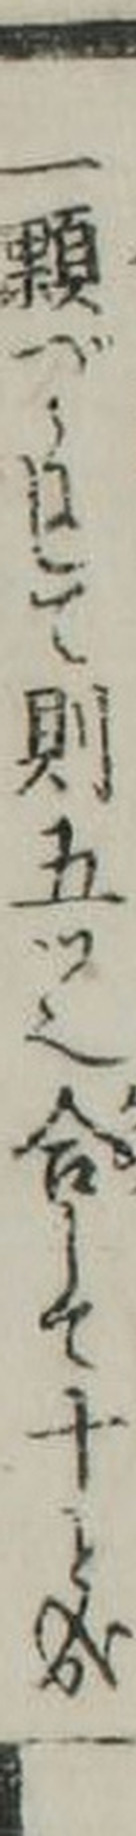一顆づゝにして則五ツ也合して十と成
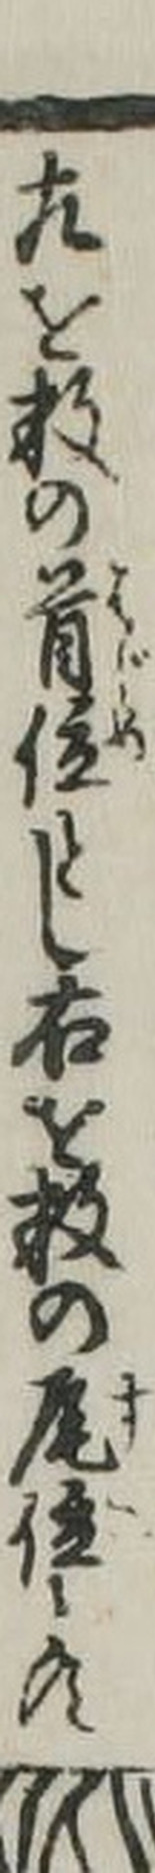左を数の首位とし右を数の尾位とす
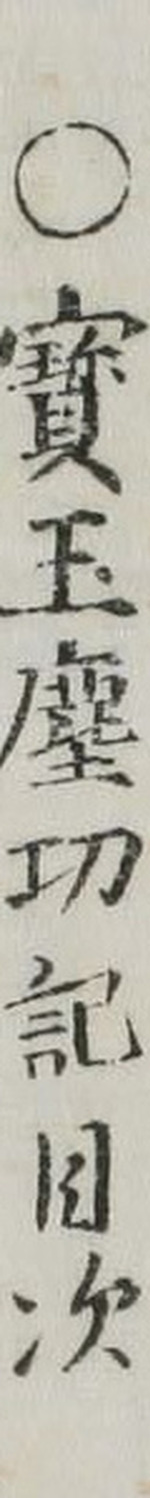○宝玉塵功記目次
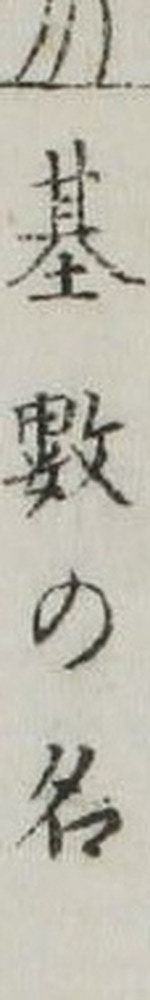基数の名
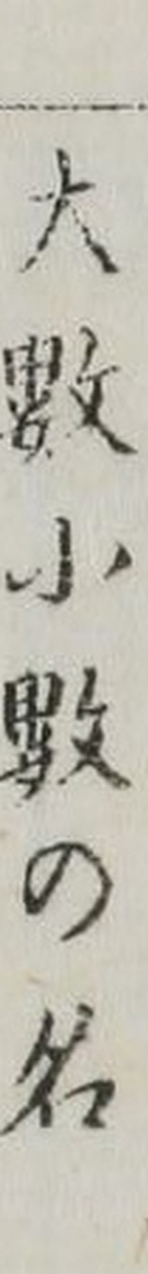大数小数の名
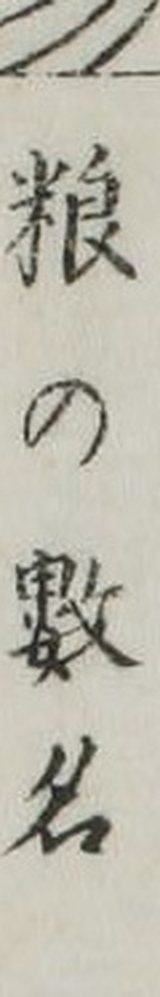粮の数名
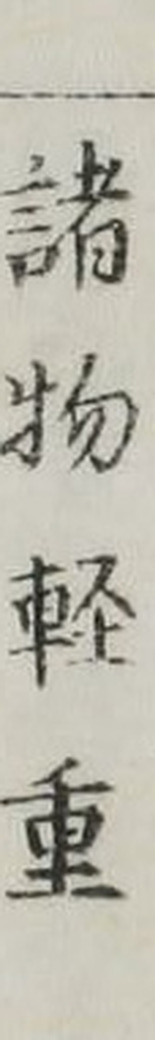諸物軽重
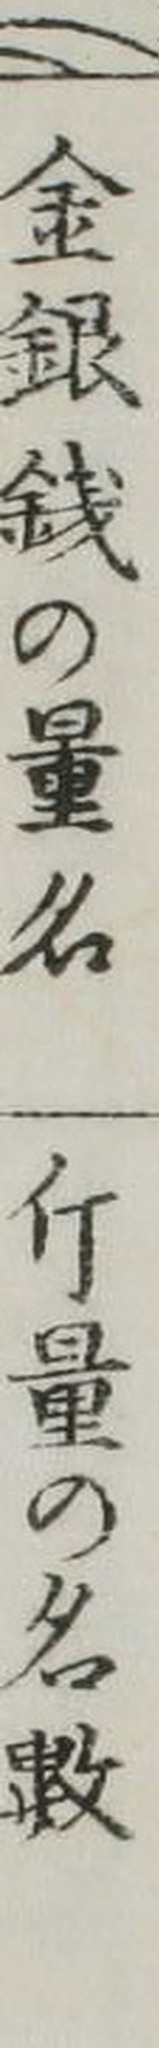金銀錢の量名
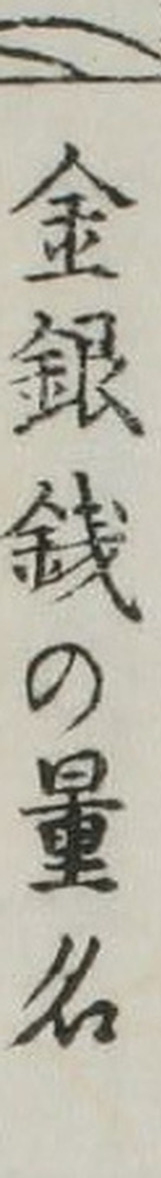金銀錢の量名
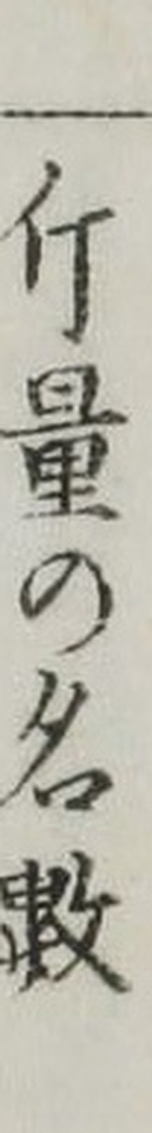斤量の名数
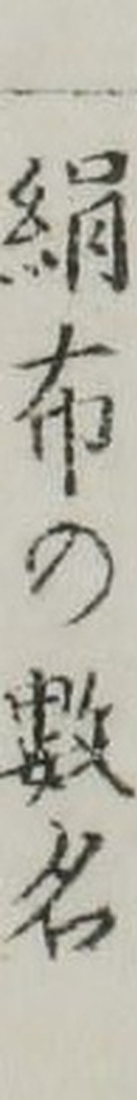絹布の数名
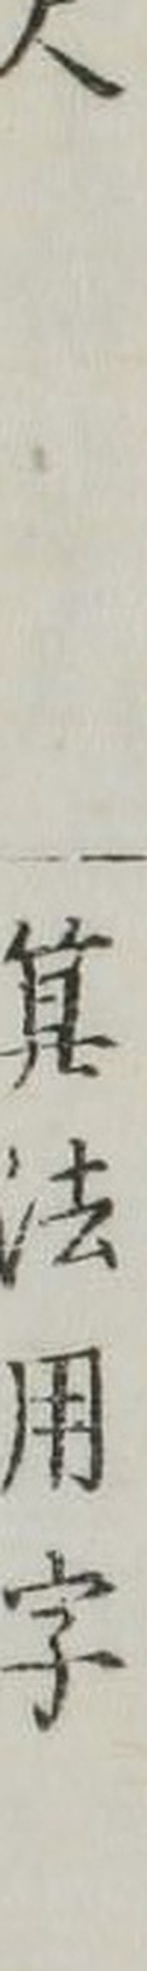算法用字
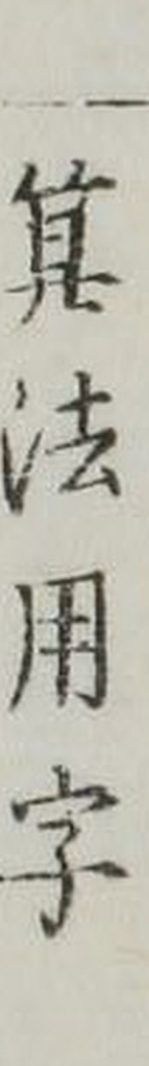算法用字
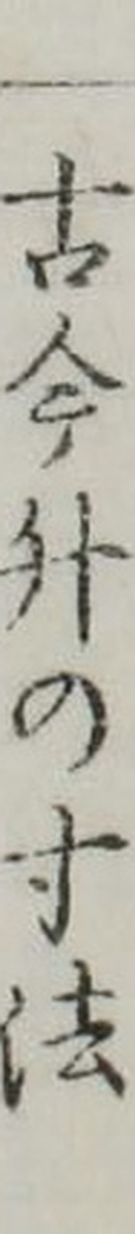古今升の寸法
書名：宝玉塵劫記
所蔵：東京学芸大学教育コンテンツアーカイブ
